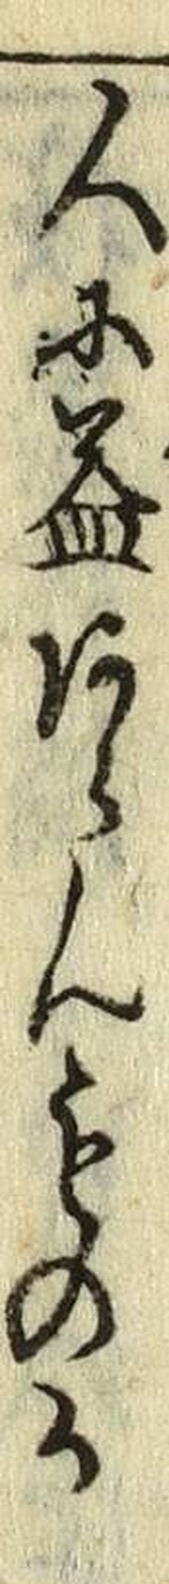人に益あらんものか
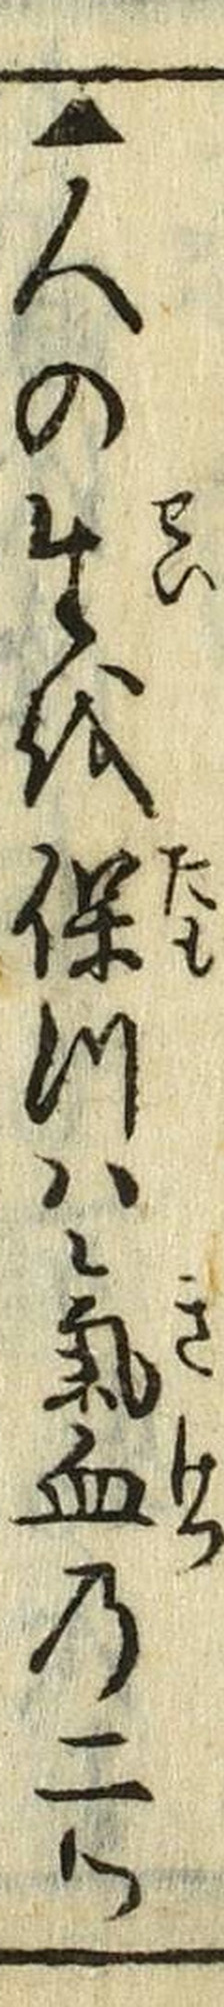▲人の生を保つは気血の二ツ
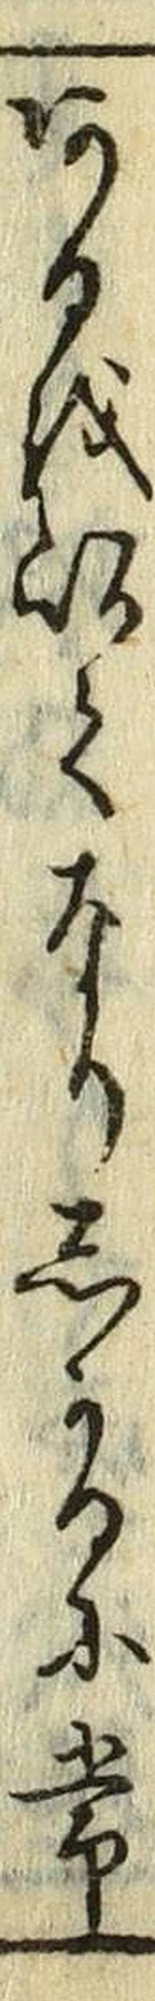あるを以てなりしかるに常
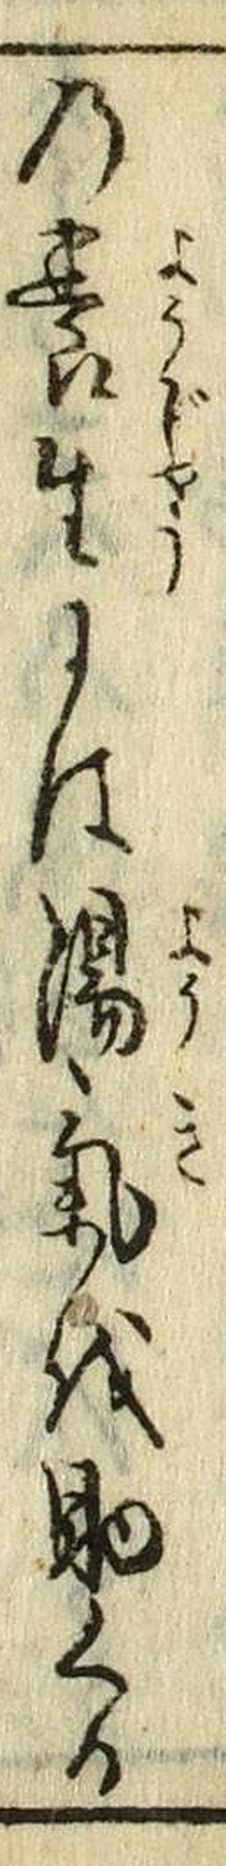の養生には陽気を助くる
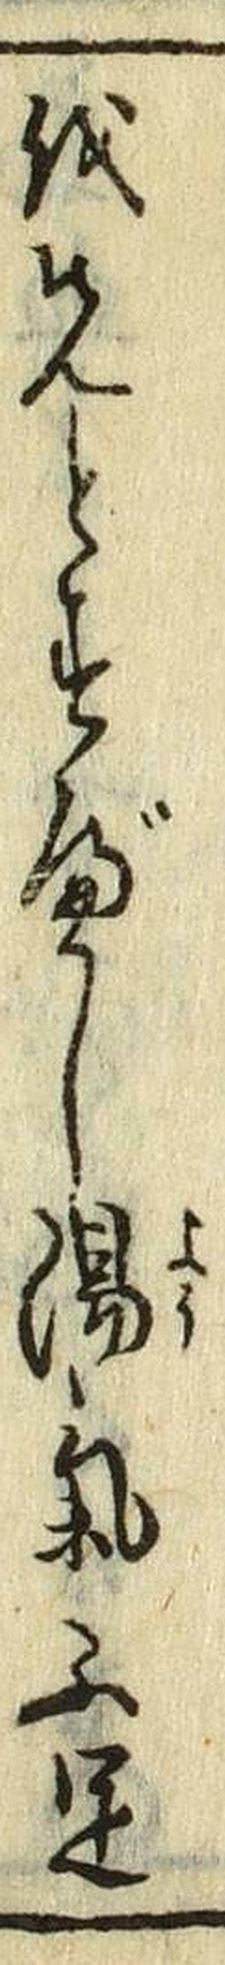を先とすべし陽気不足
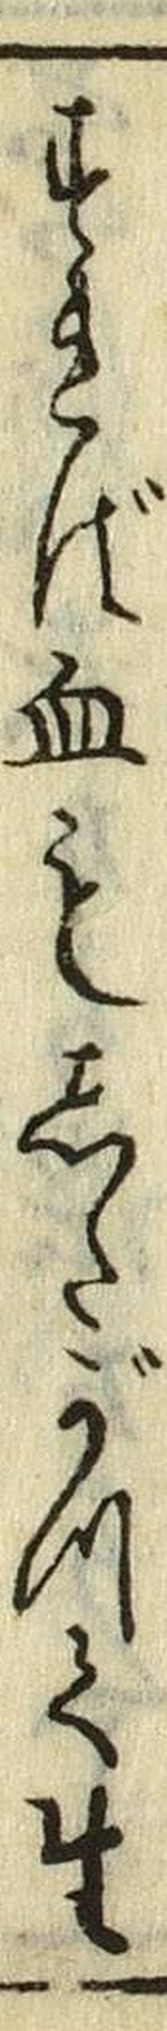すれば血もしたがつて生
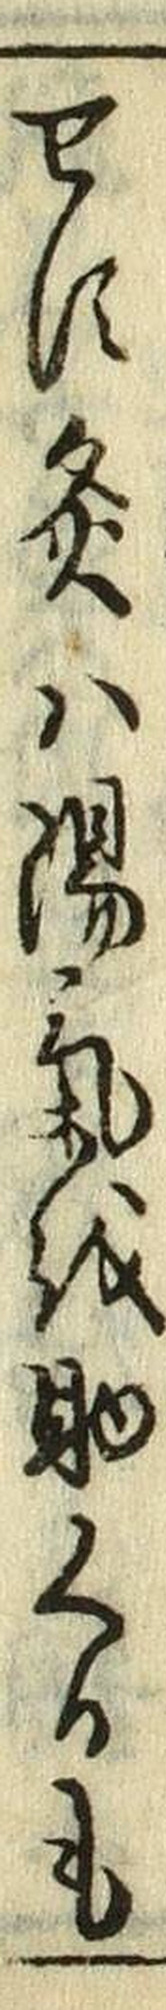せす灸は陽気を助くるも
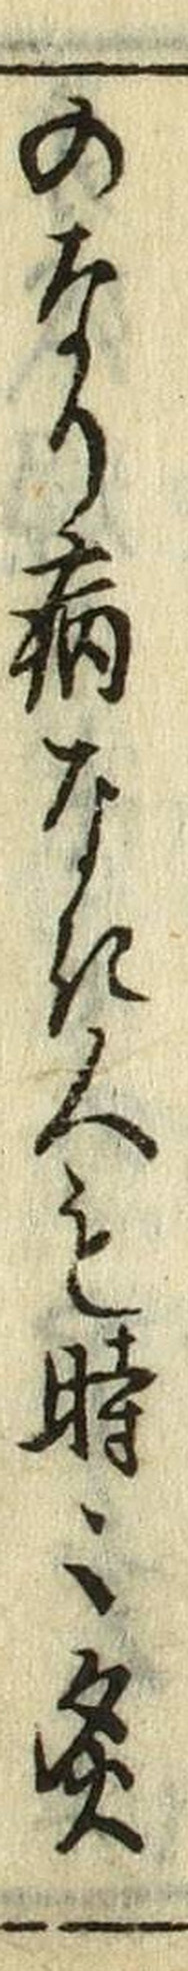のなり病なき人も時々灸
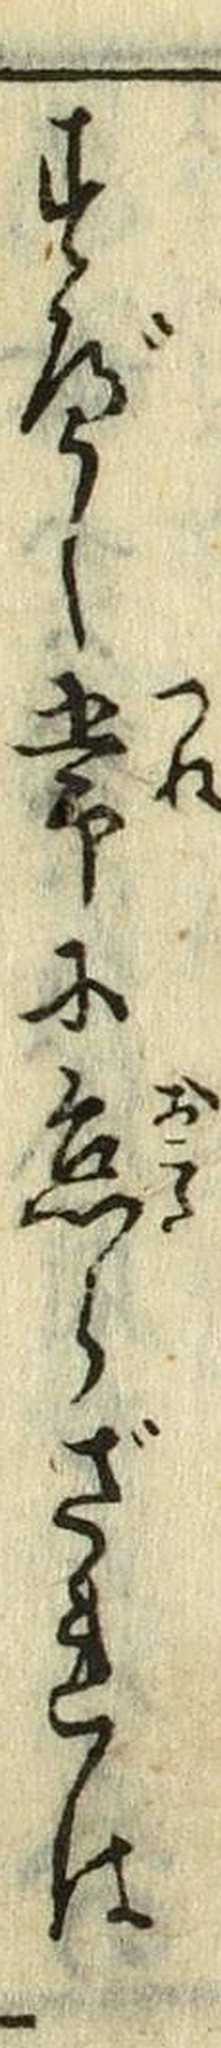すべし常に怠らざれは
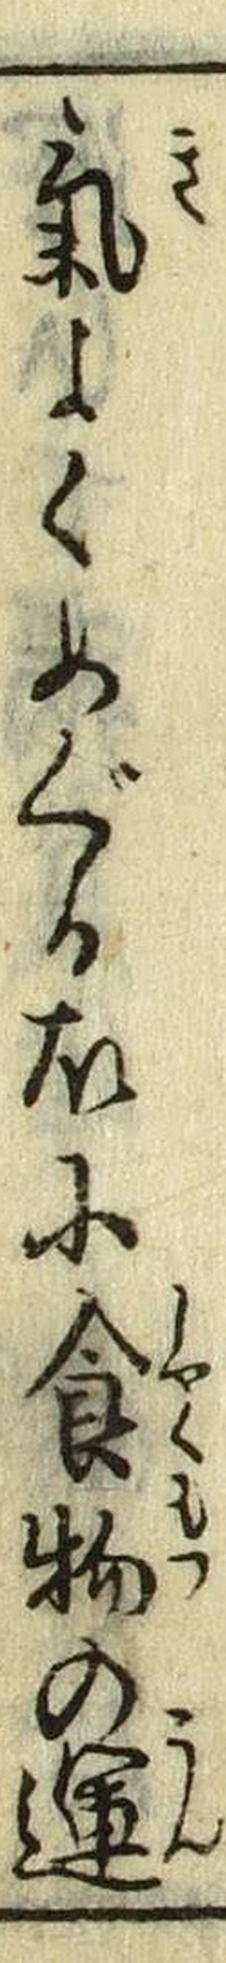気よくめぐる故に食物の運
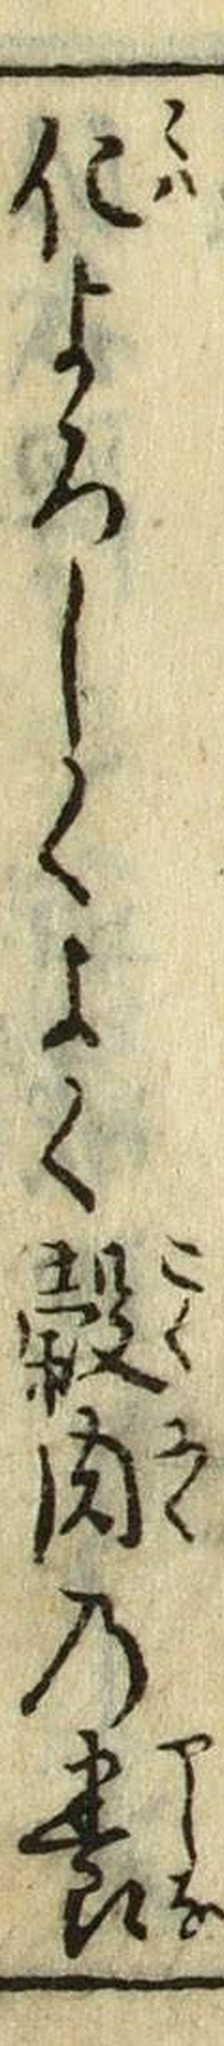化よろしくよく穀肉の養

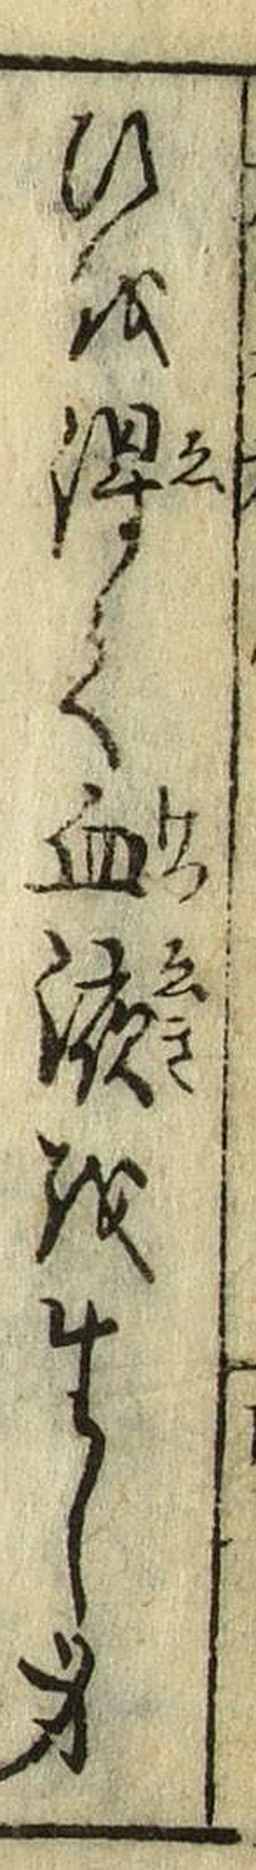ひを得て血液を生し身
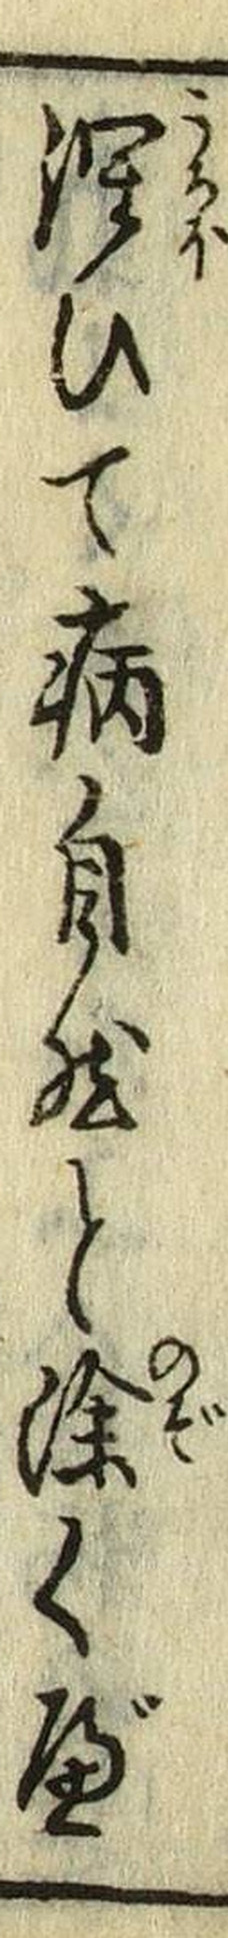潤ひて病自然と除くべ
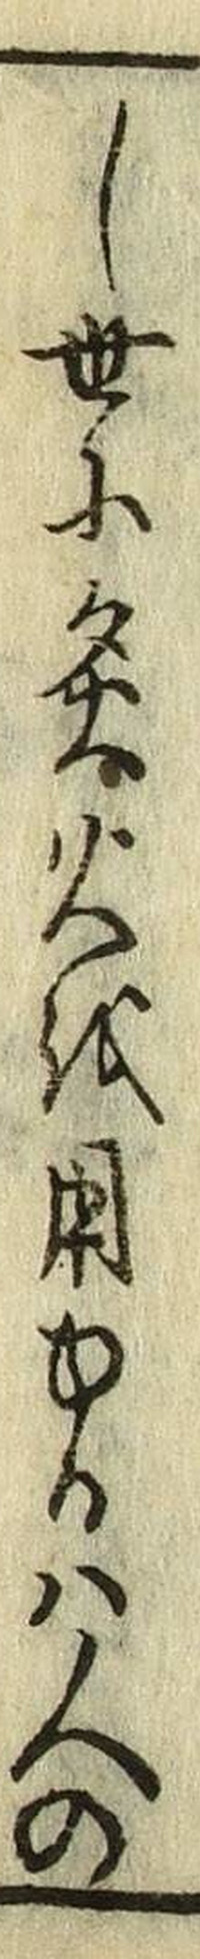し世に灸火を用ゆるは人の
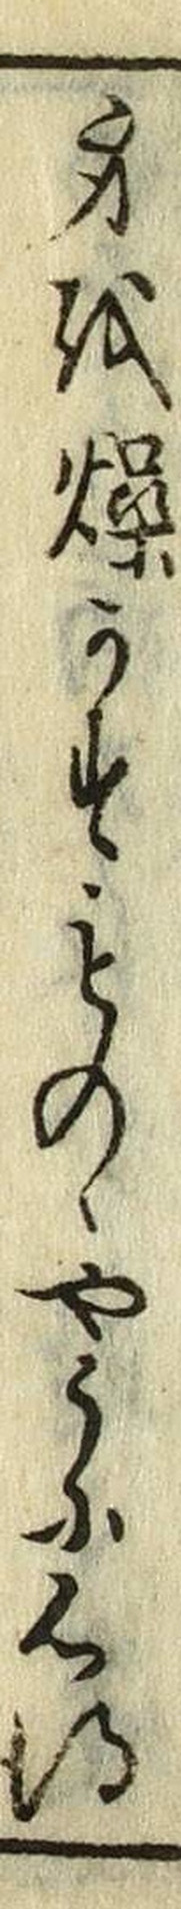身を燥かすものゝやうに心得
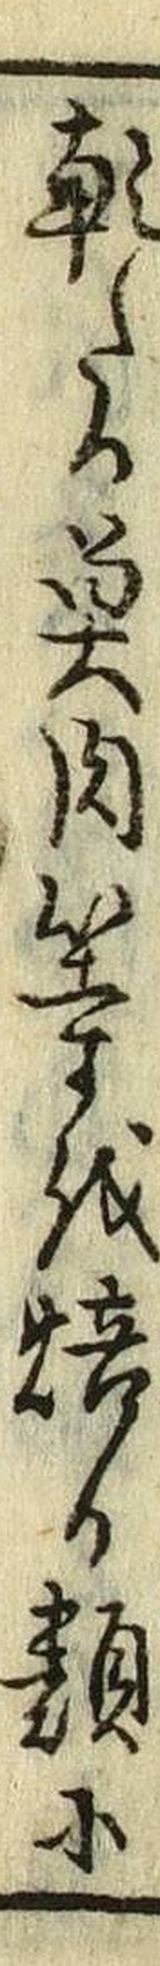乾たる魚肉等を焙る類に
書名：居家養生記
